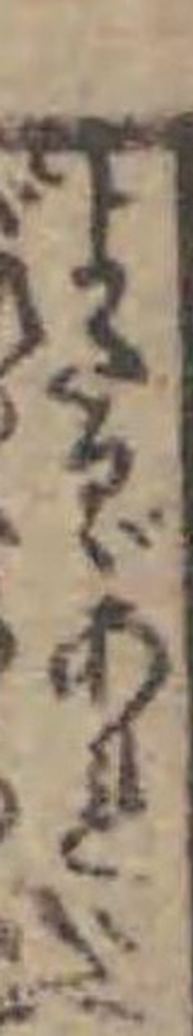よたかゞあれ
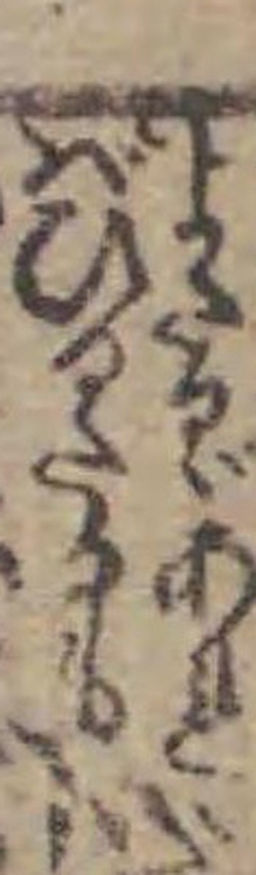ばひるたかも
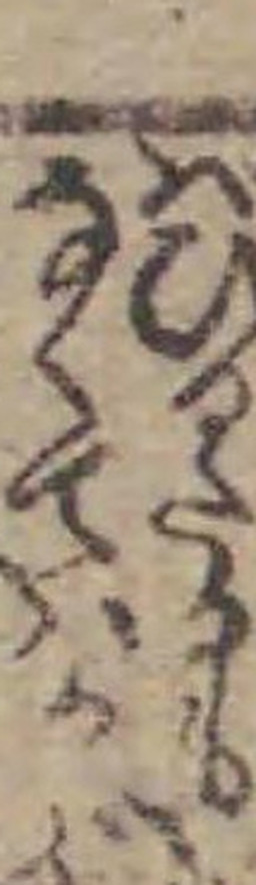なくてはか
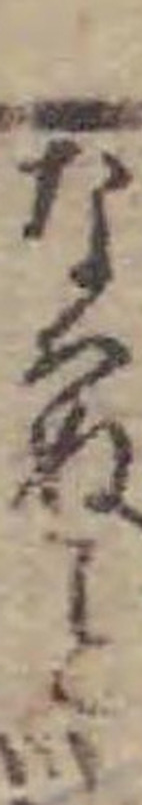なはぬこと
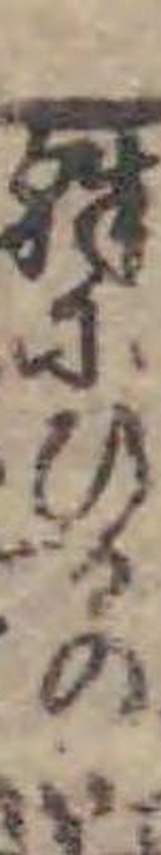殊にひるの
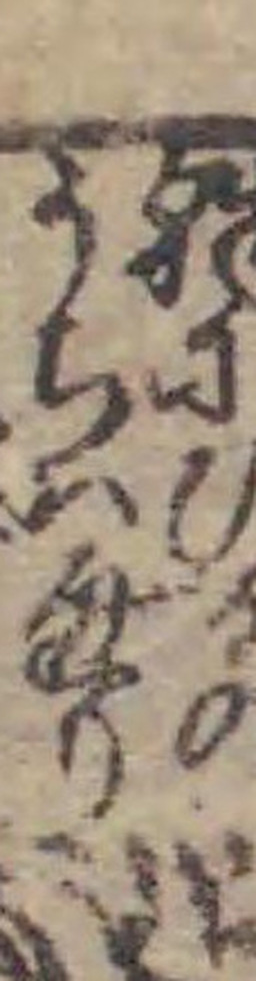うちは通り
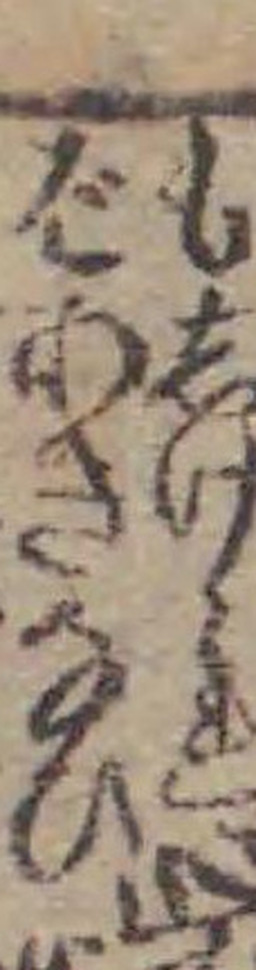ばあきなひ
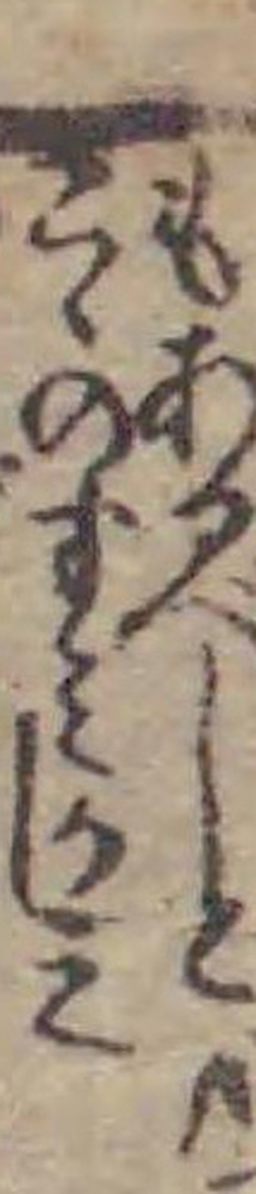こゝのすみかしこ
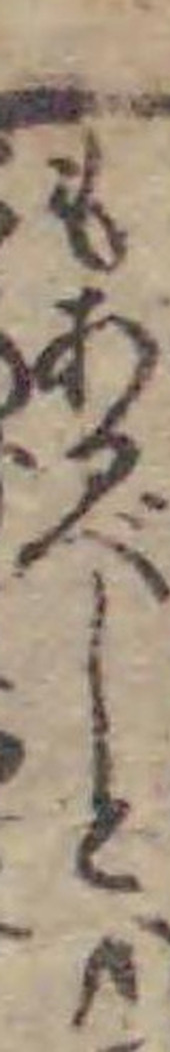もあるべしと
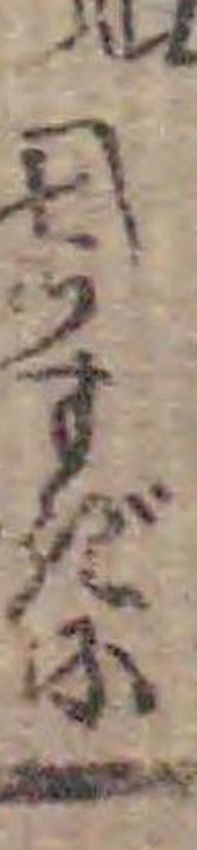〽七つすぎに
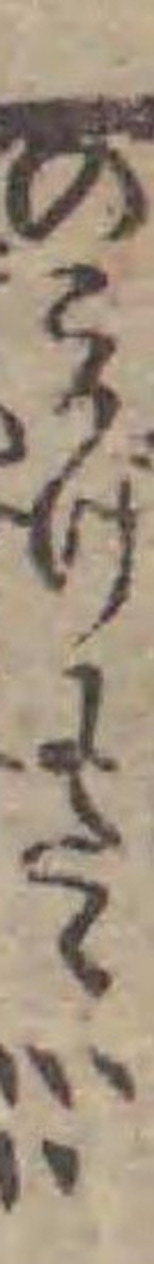のこかげにたゝ
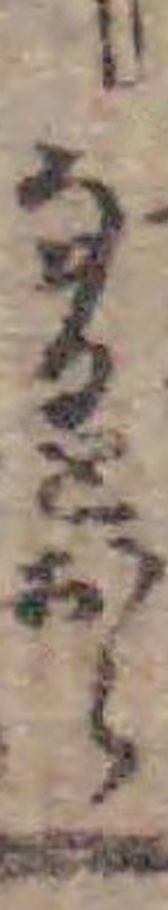なるとおら
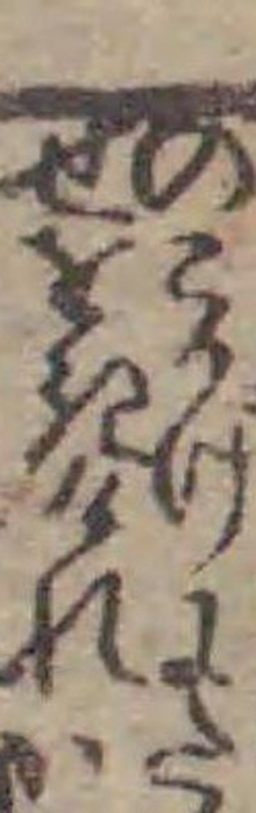せおきけれ
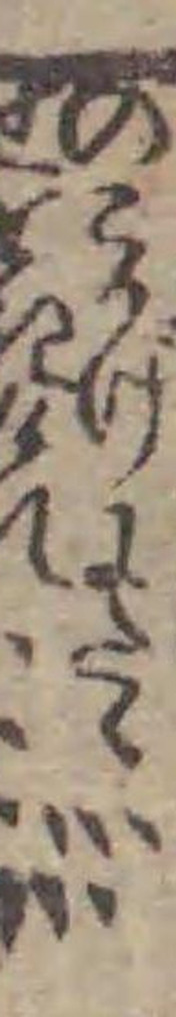のこかげにたゝ
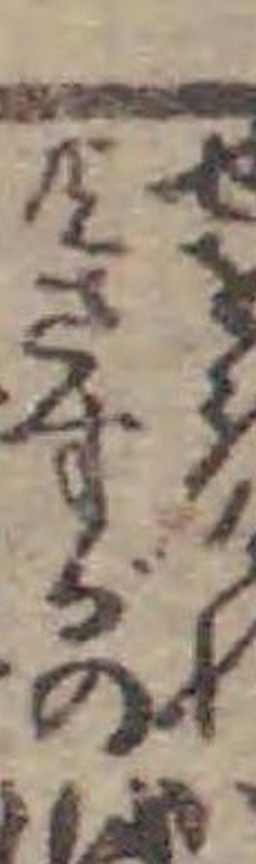共さすがの
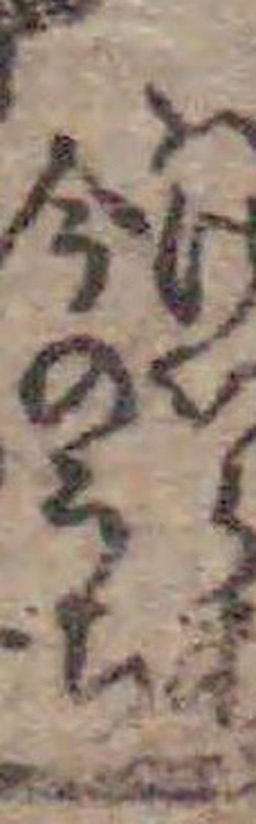今のうち
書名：本樹真猿浮気噺 : 3巻
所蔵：国立国会図書館 National Diet Library, JAPAN
